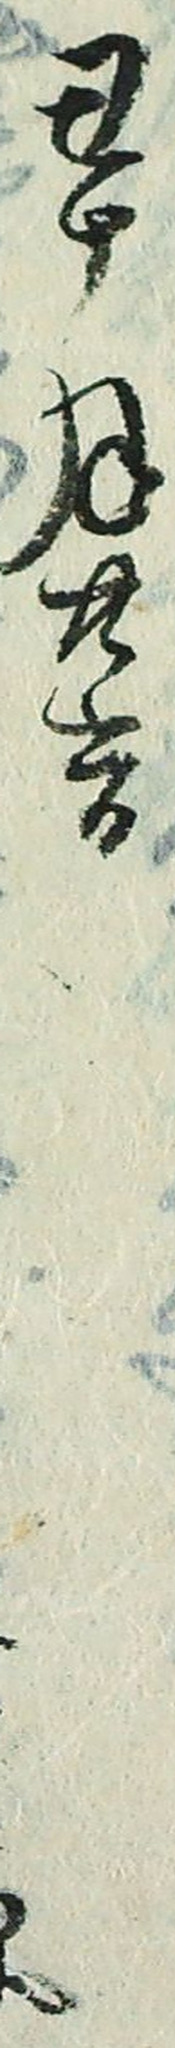丑十月廿六日
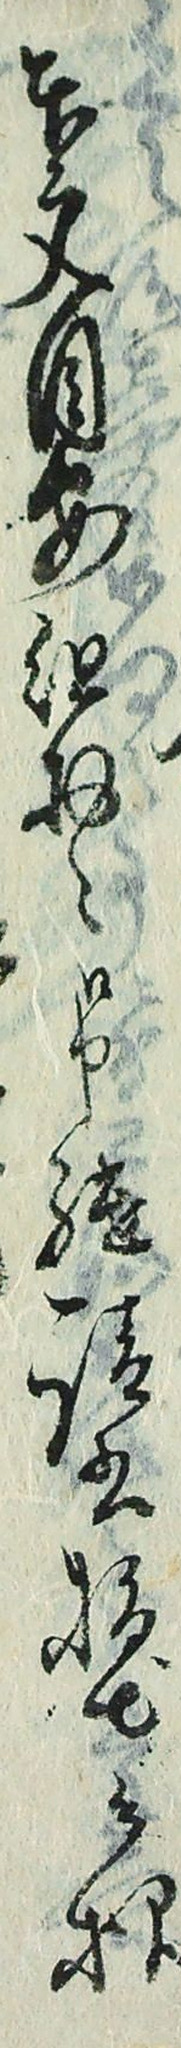本文目安組村々江申継請書指出候様
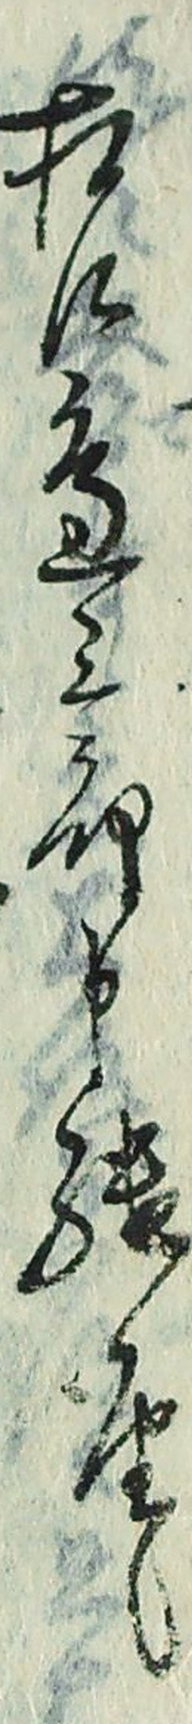松江島三郎申継御坐候
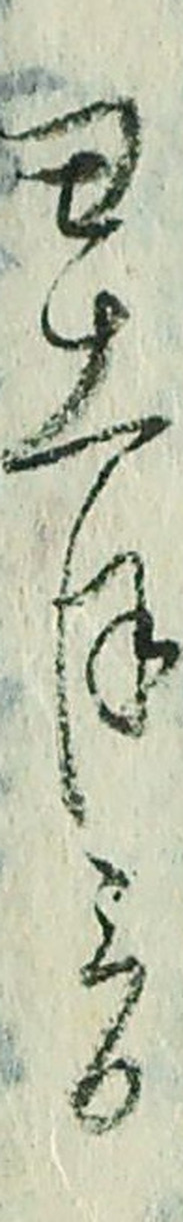丑十一月三日
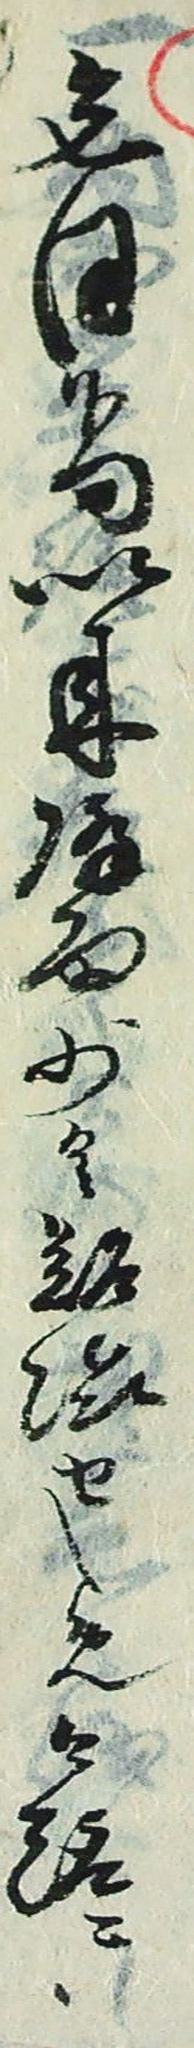先月下旬以来降雨少く難渋せしめ候趣ニ
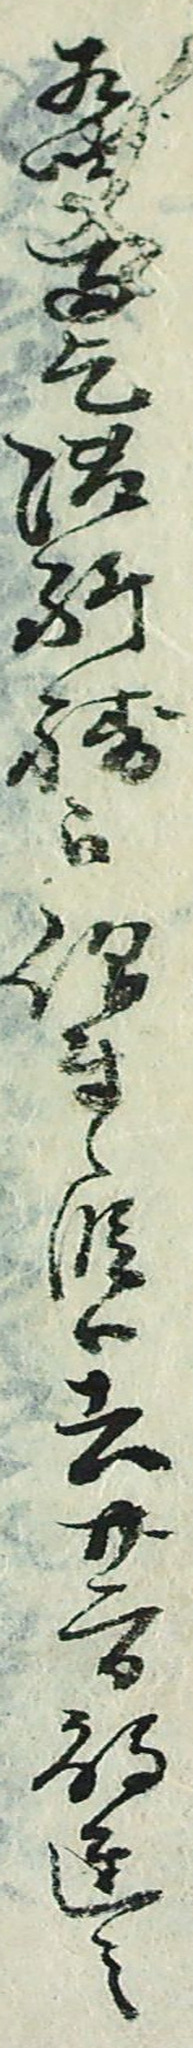相聞雨乞御祈祷被仰付之段ハ去廿二日触達之
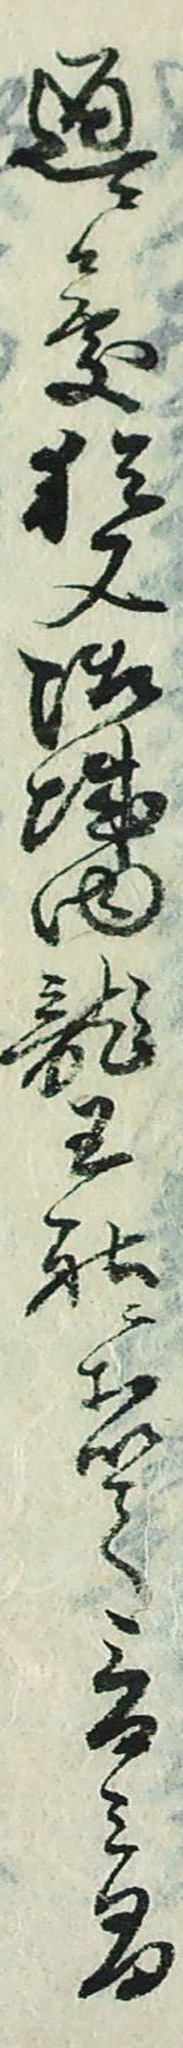通ニ候處猶又御城内龍王社ニおいて三日之間
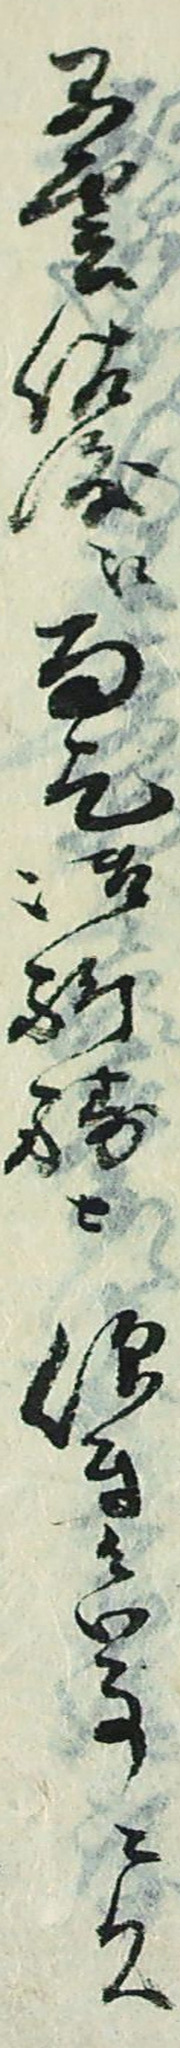早雲佐渡江雨乞御祈祷被仰付候御事ニ候
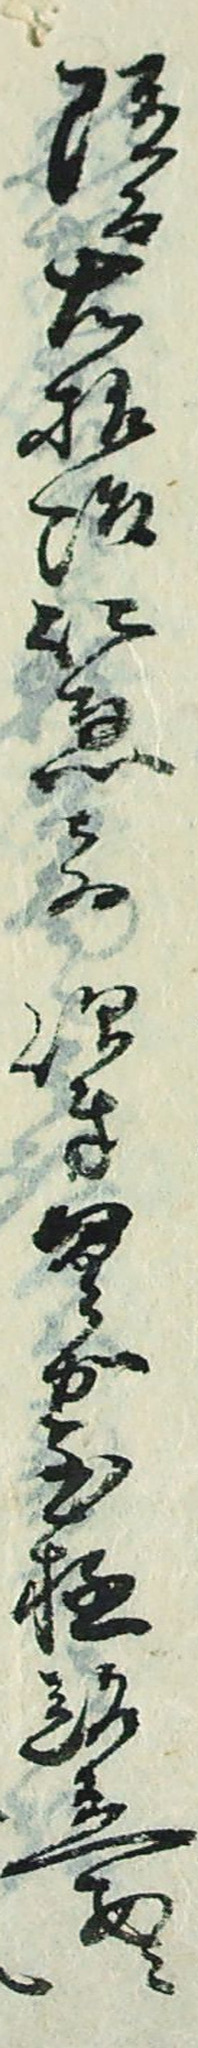随而右様御仁恵被為仰付冥加至極難有義ニ
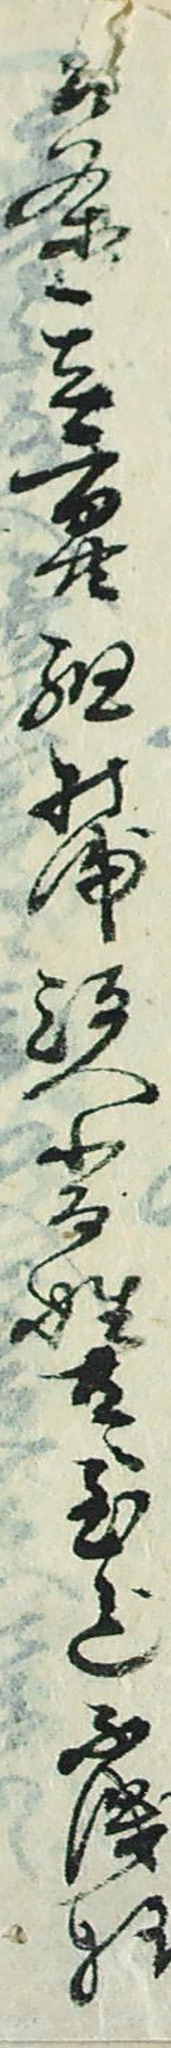候条其方共組村浦役人小百姓共へ至迄不洩様
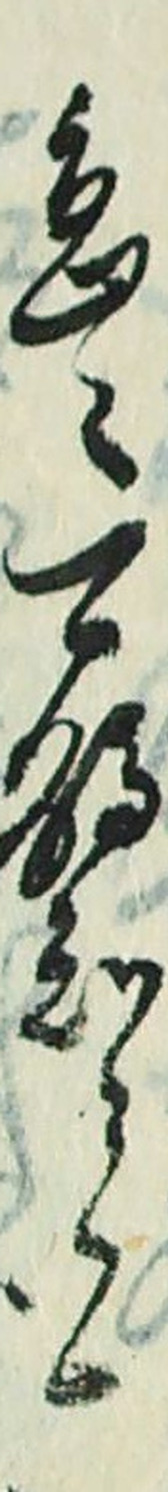急々可触知候以上
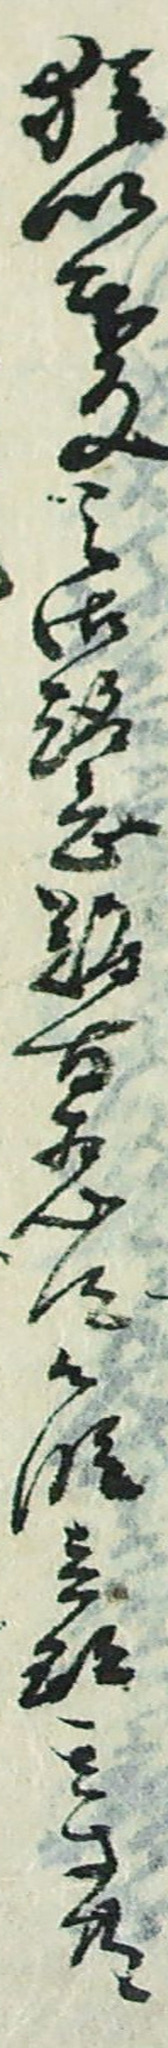猶以本文之御趣意難有相心得候段壱郡其方共
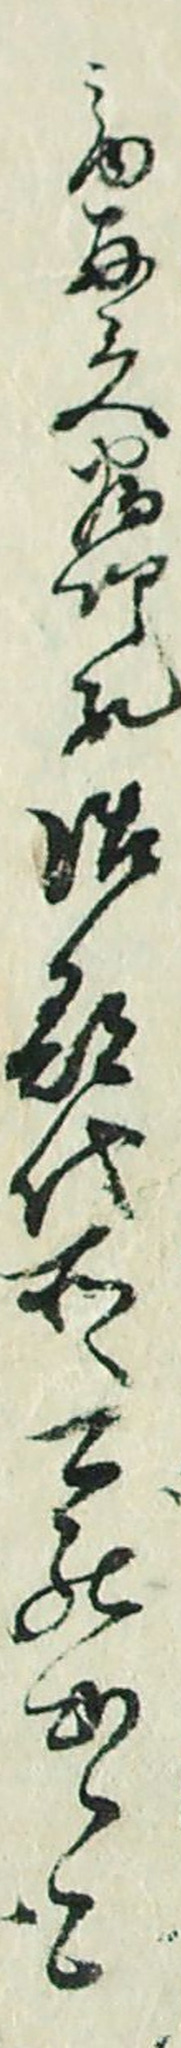之内両三人為御礼御郡代所へ可罷出候以上

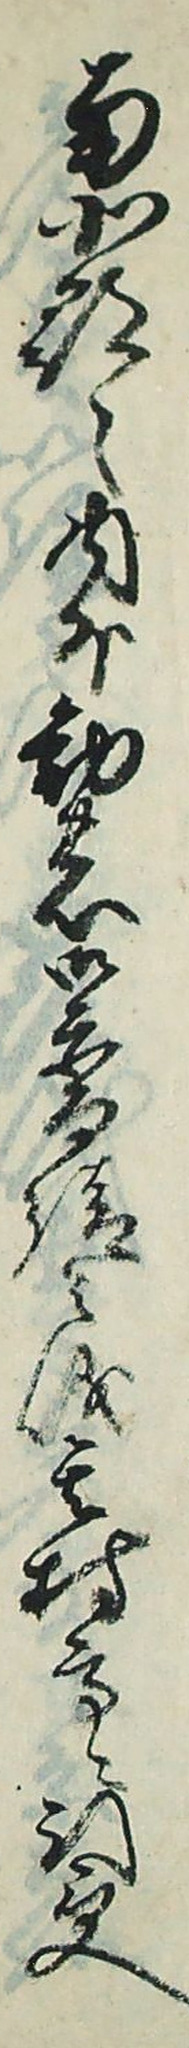南北郡之内外勧農御普請之儀其村方ニ引受
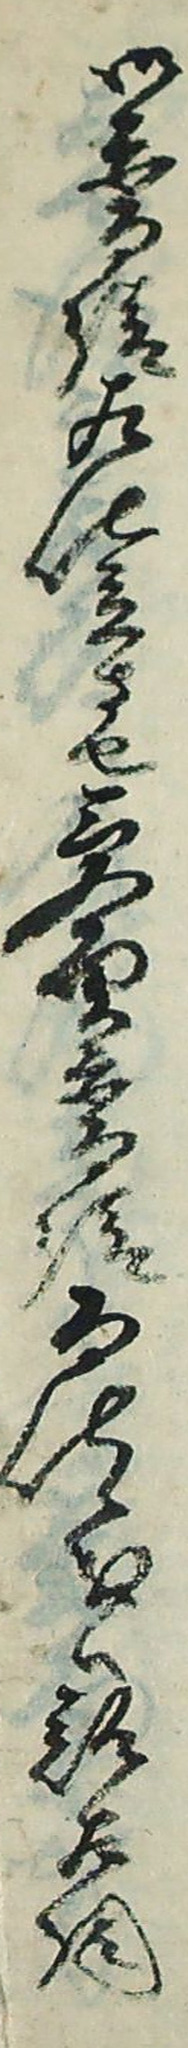御普請相仕立させ受負普請為仕候義ハ難相調
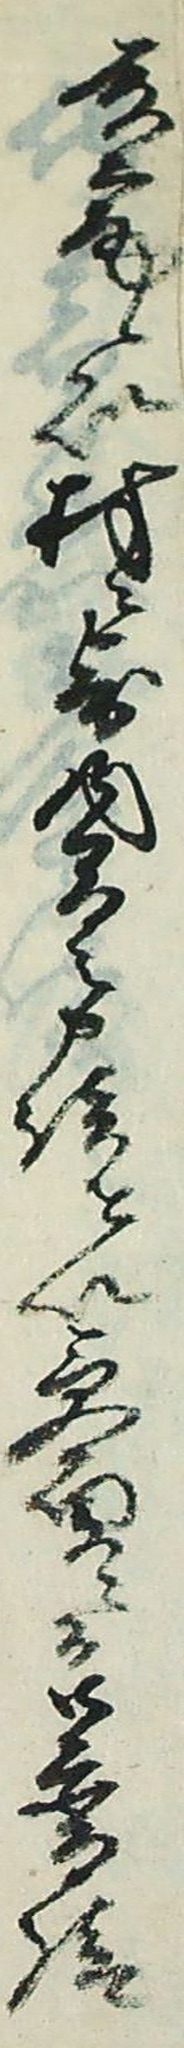取究候処村々寄内間之申談を以受負ニ而御普請
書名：諸御趣意書并御下知向之写
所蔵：鳴門教育大学 Naruto University of Education
